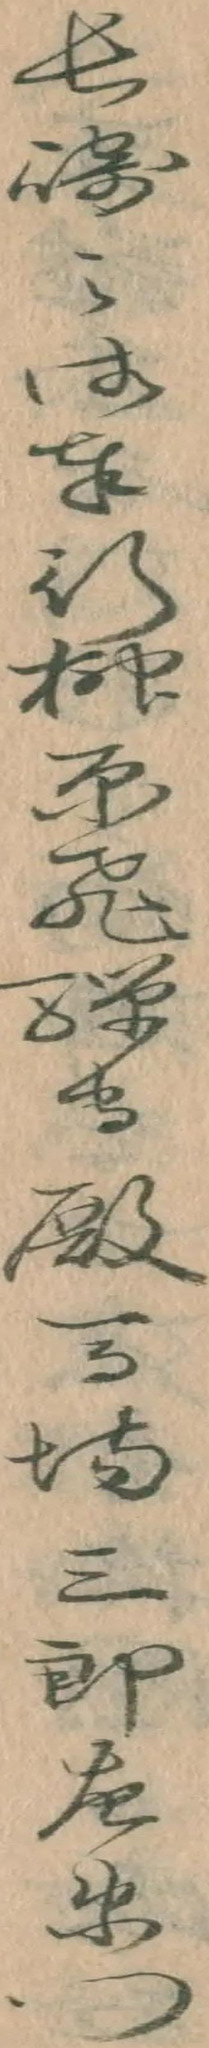長崎之御奉行榊原飛騨守殿馬場三郎左衛門
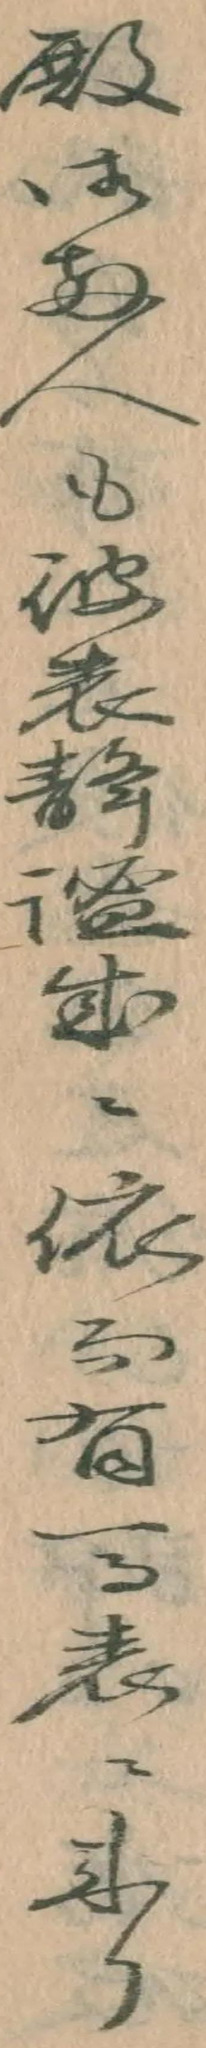殿御両人も彼表静謐成に依而有馬表に来り
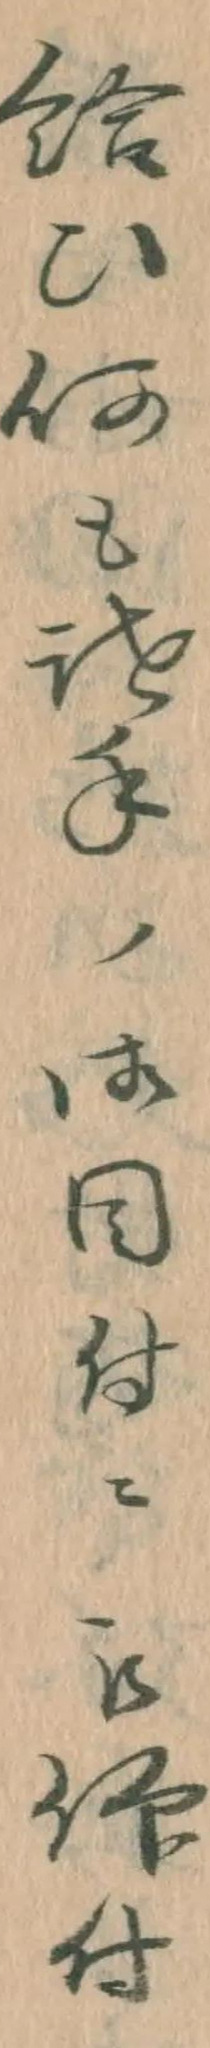給ひ何も諸手之御目付に被仰付
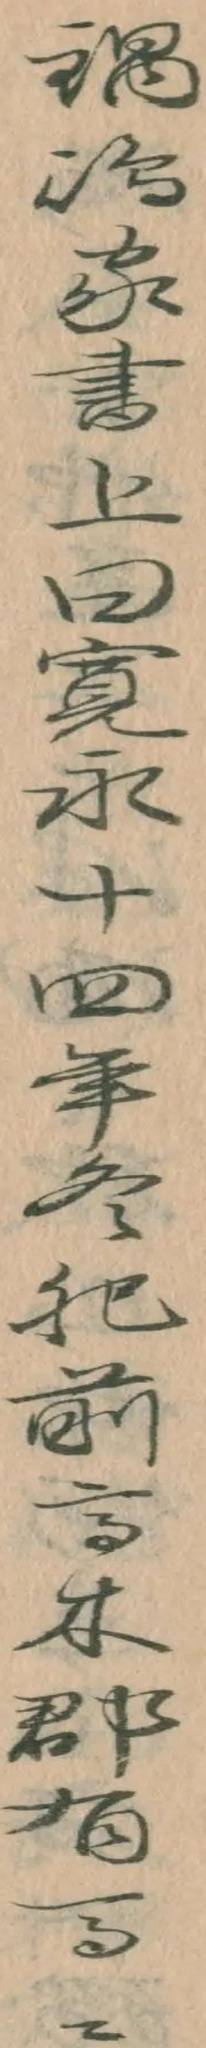鍋島家書上曰寛永十四年冬肥前高木郡有馬に
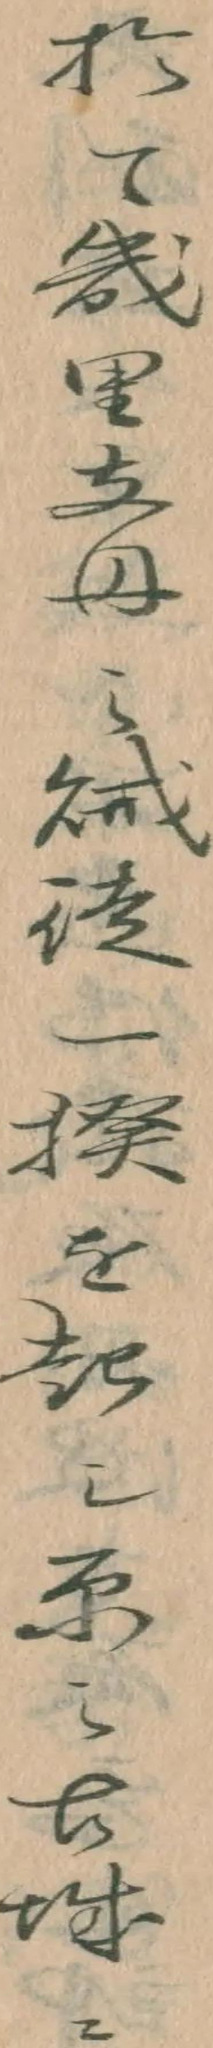於て幾里支丹之賊徒一揆を起し原之古城に
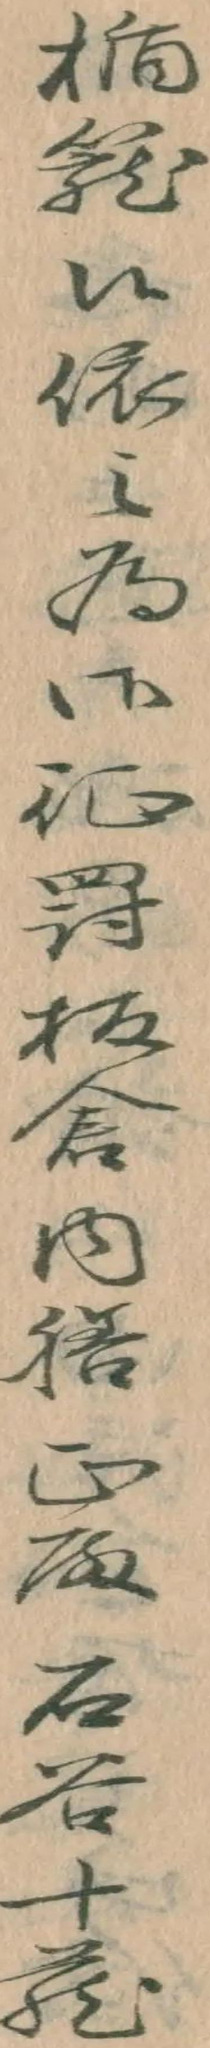楯籠候依之為御征罸板倉内膳正殿石谷十蔵
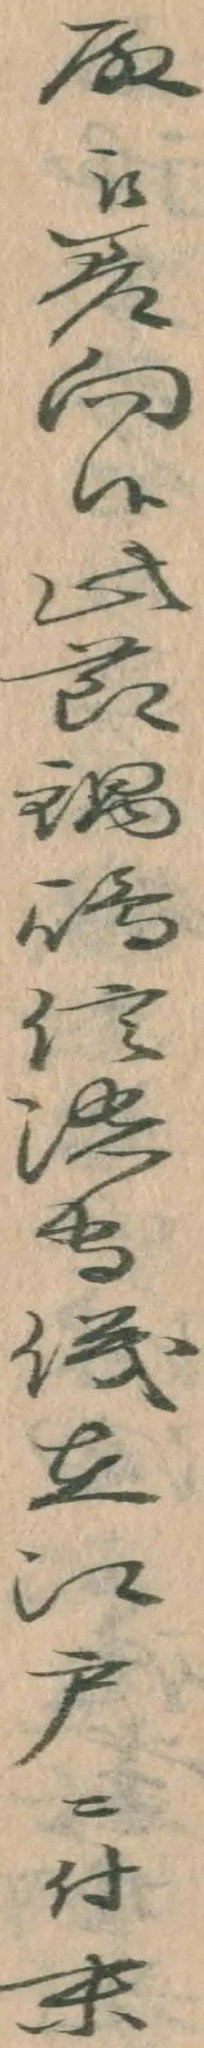殿被差向候此節鍋島信濃守儀在江戸に付末
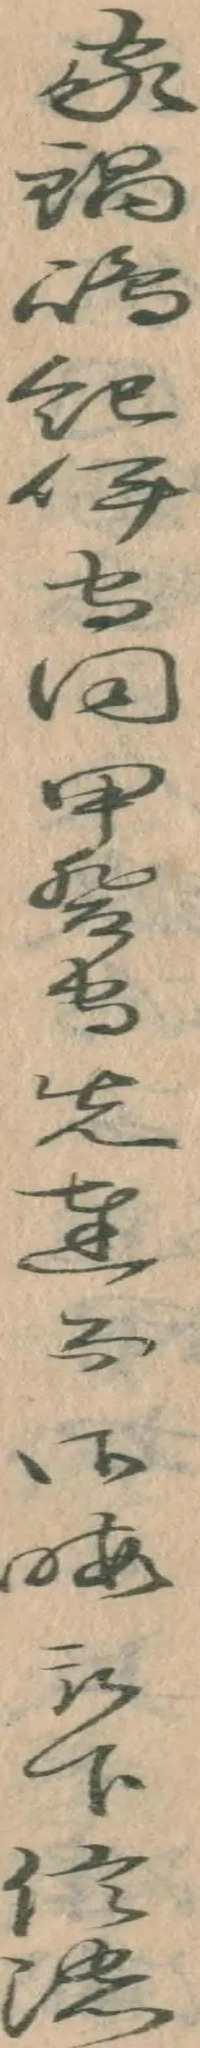家鍋島紀伊守同甲斐守先達而御暇被下信濃
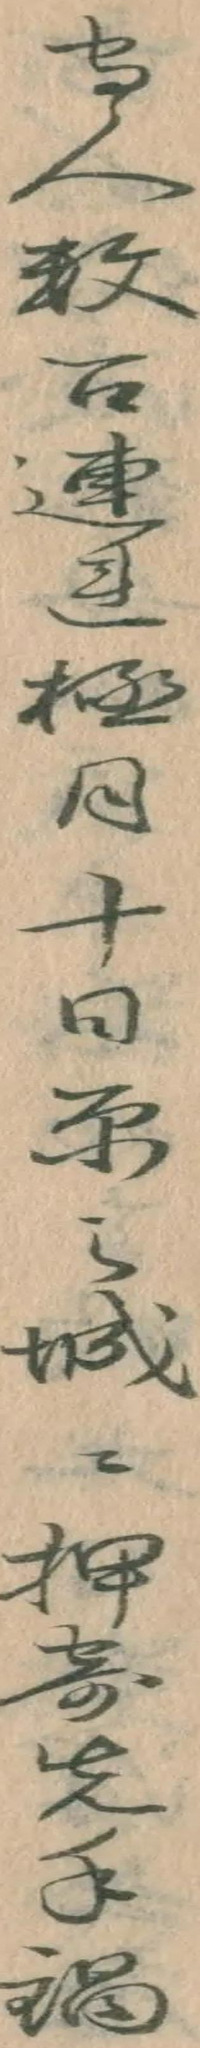守人数召連連極月十日原之城に押寄先手鍋
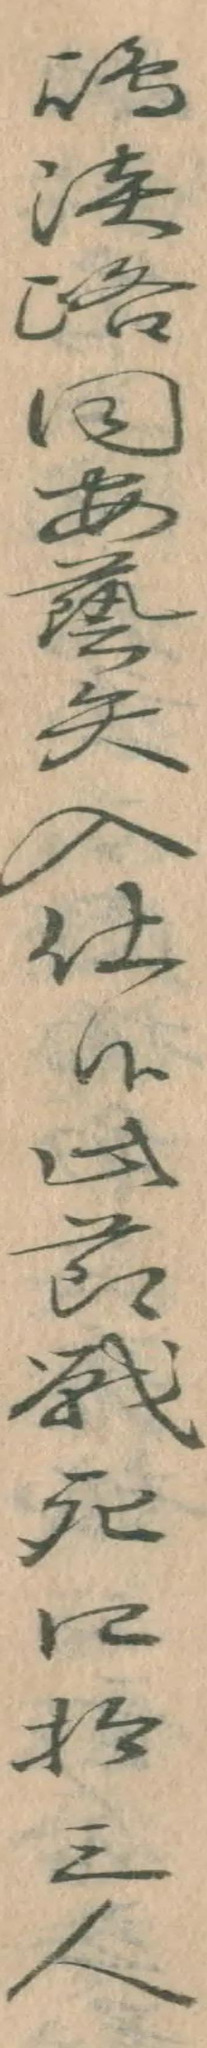島談路同安芸矢入仕候此節戦死四拾三人
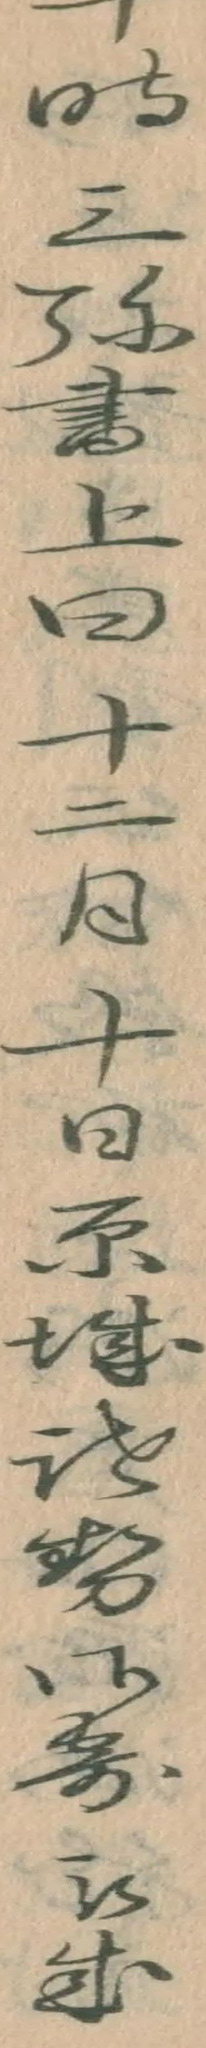十時三弥書上曰十二月十日原城諸勢御寄被成
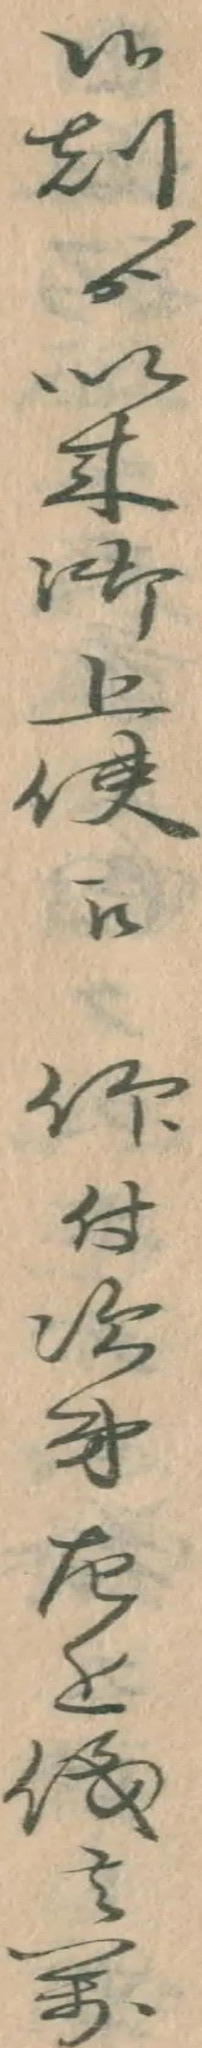候刻ゟ以来御上使被仰付次第左近儀者万
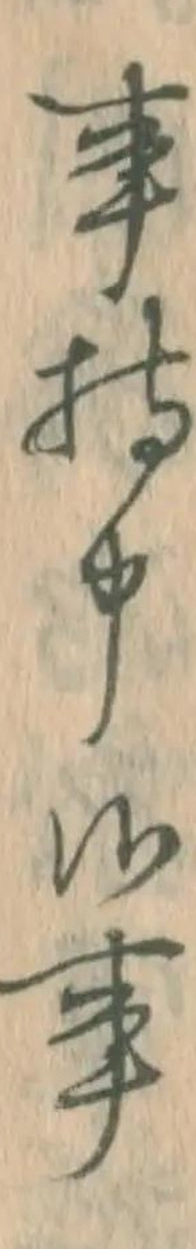事持申候事

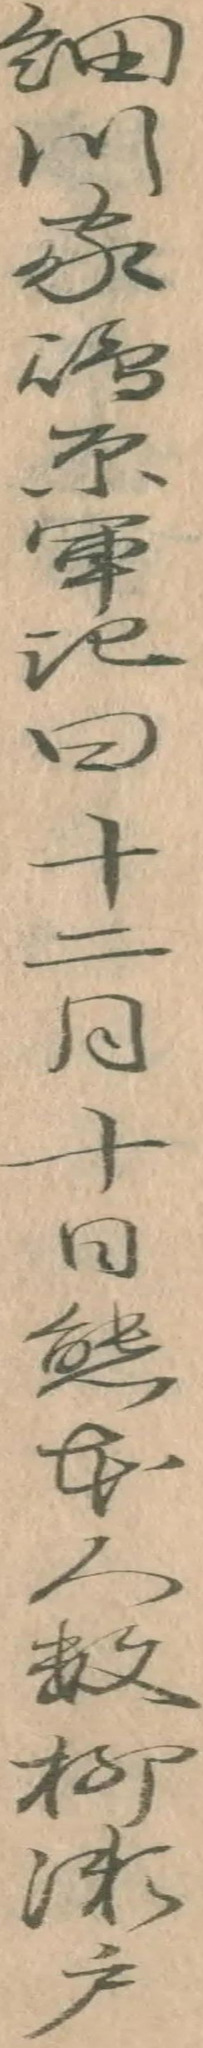細川家島原軍記曰十二月十日熊本人数柳瀬戸
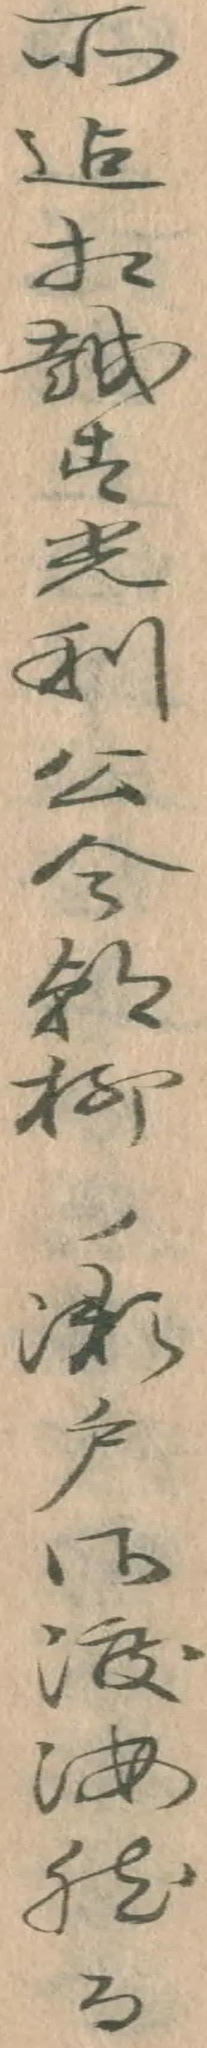所迄相越春光利公今朝柳之瀬戸御渡海然る
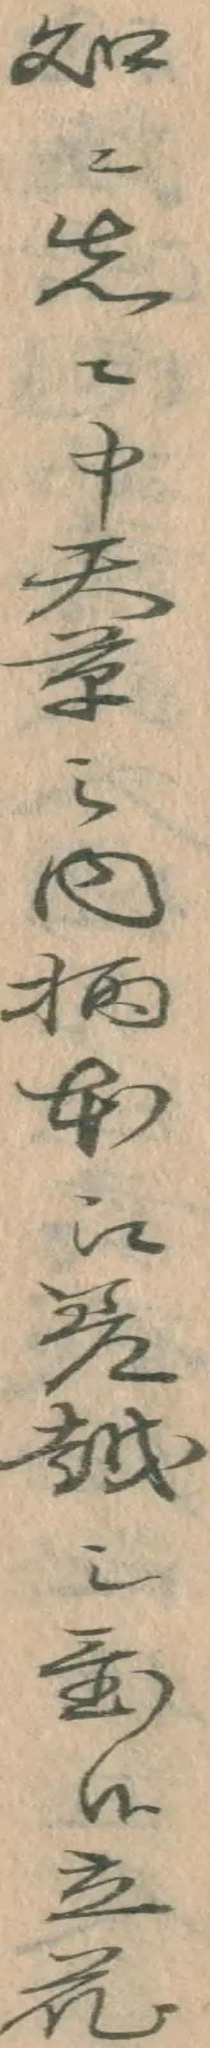処に先に申天草之内栖本江差越し置候立花
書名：切支丹御退治記 49巻. [4]
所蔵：国立国会図書館 National Diet Library, JAPAN
